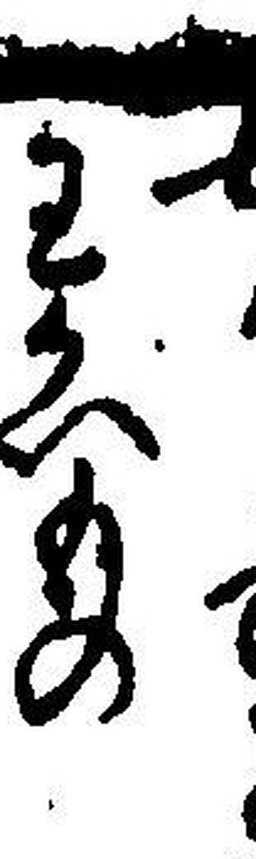わかいもの
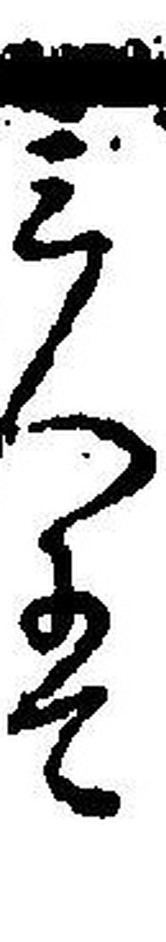三人にて
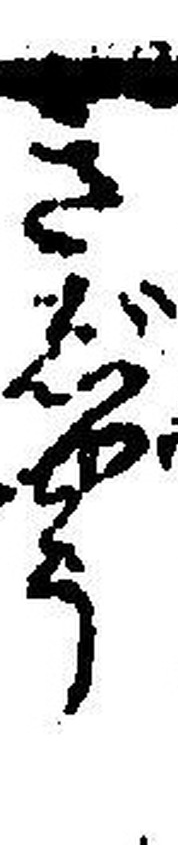きじやう
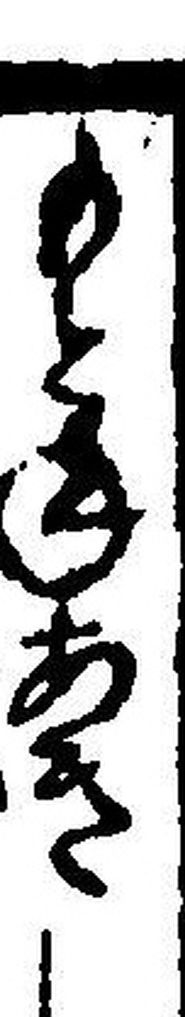もとねあき
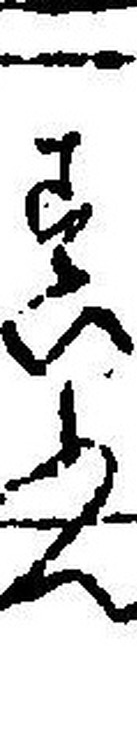すいふん
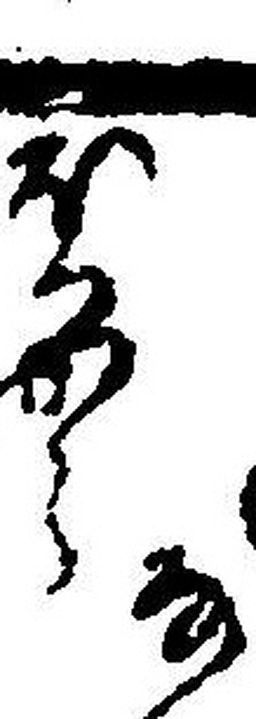ほかから
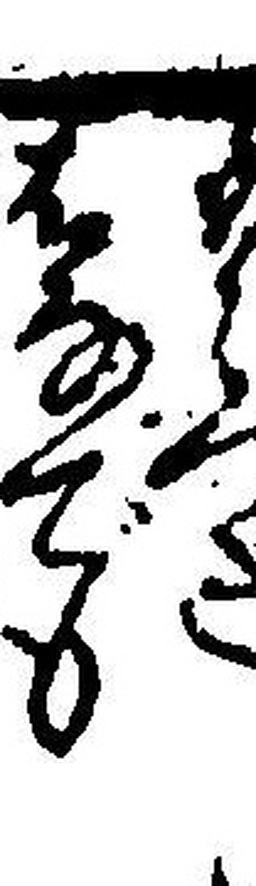はなでも
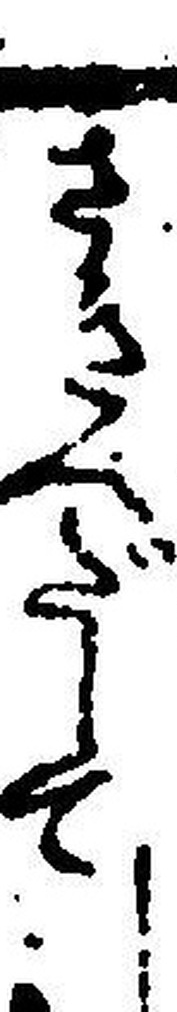さきへだして
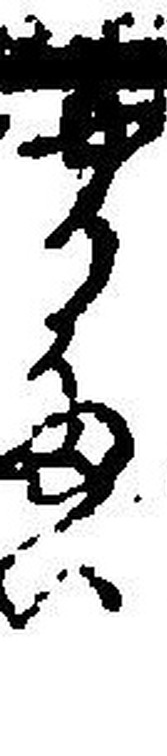やりたい
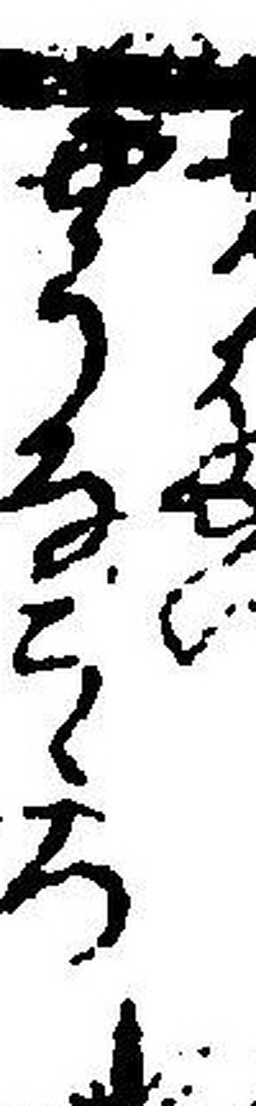やうなこゝろ
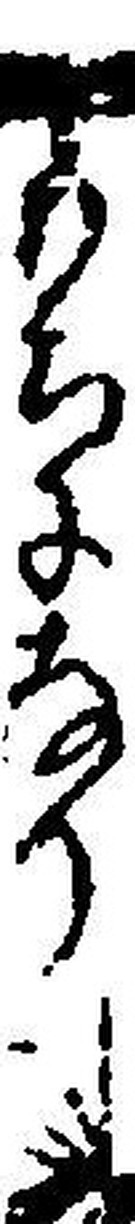もちになり
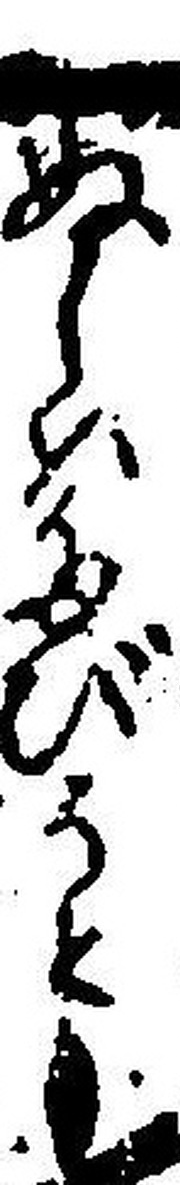ぬしはたびうと
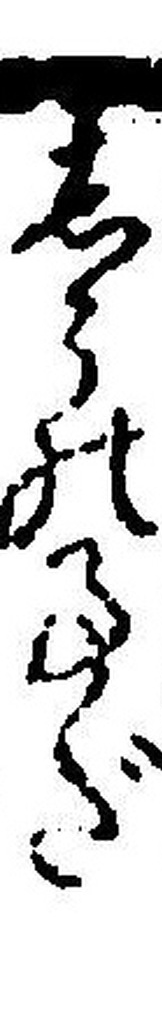しうの事だ
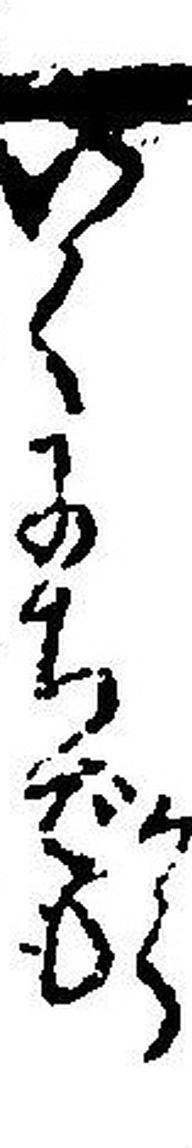いくにちでも
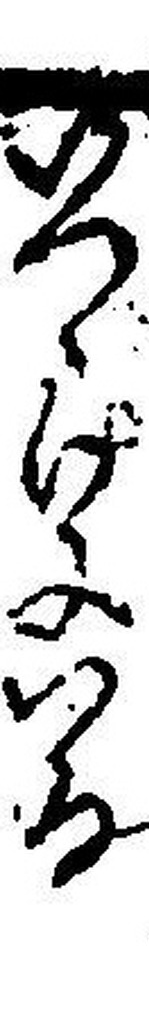いつゞけにいな
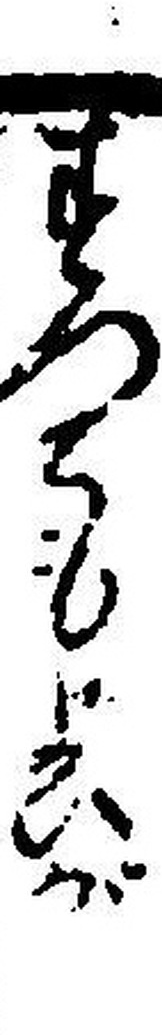すつてもよいが
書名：間違狐之女郎買 / 市場通笑作
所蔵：東京大学総合図書館 General Library in the University of Tokyo, JAPAN
